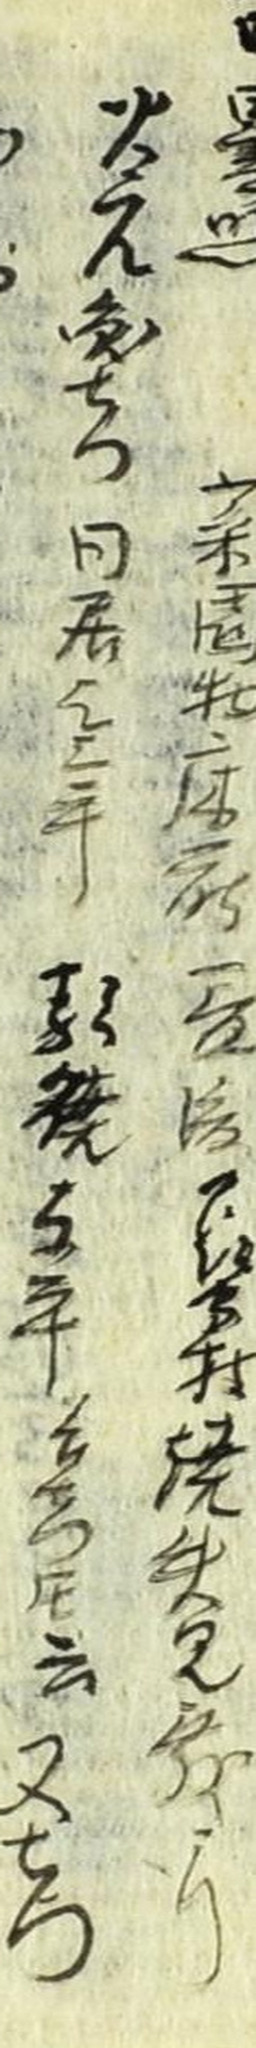火元円右衛門同居与三平類焼与平善右衛門トモ云又右衛門
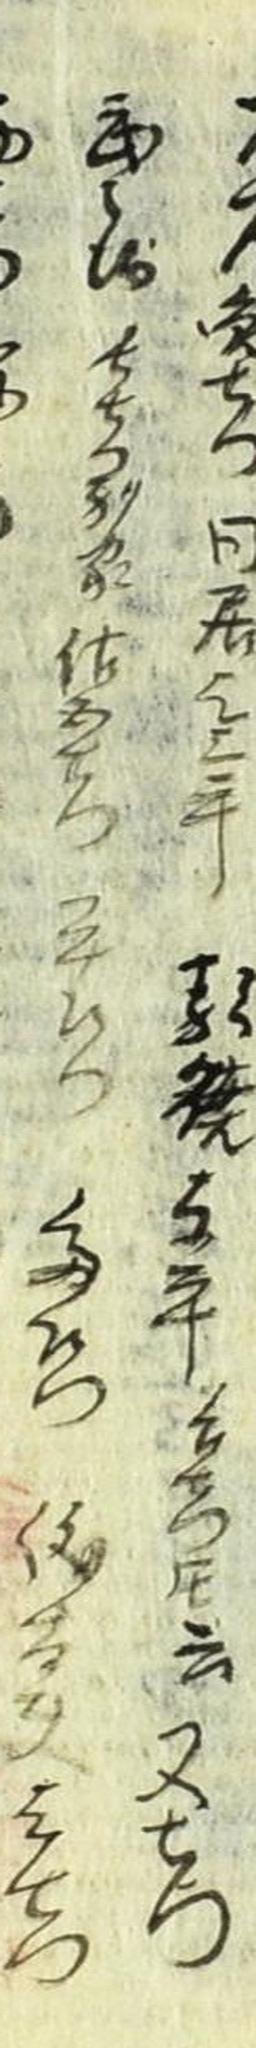武兵衛長右衛門別家佐五右衛門平左衛門多左衛門儀太夫与右衛門
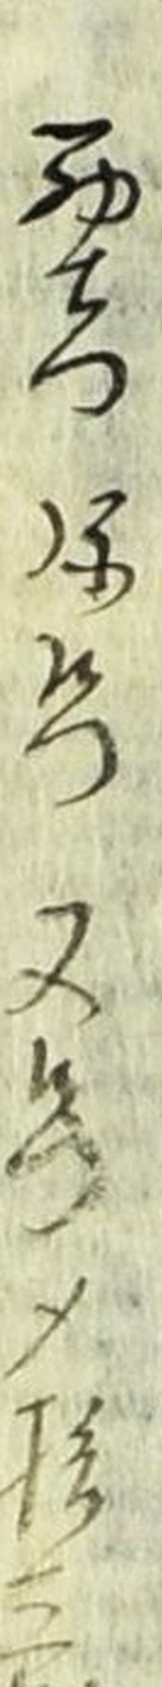西右衛門孫左衛門又左衛門〆拾三軒
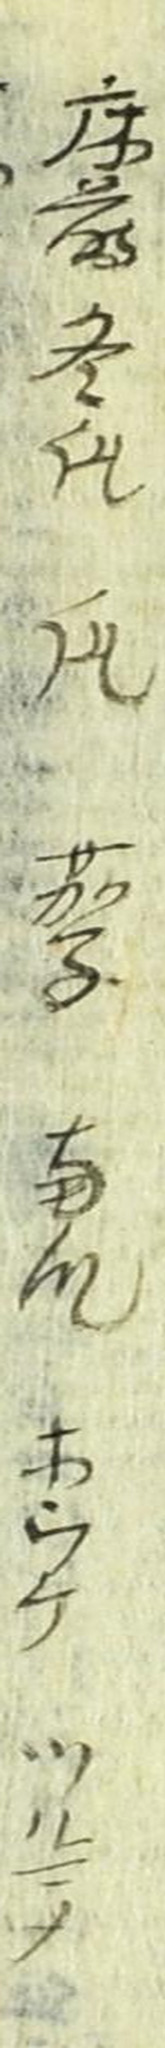床蒔冬瓜瓜茄子南瓜ホウケツルマメ
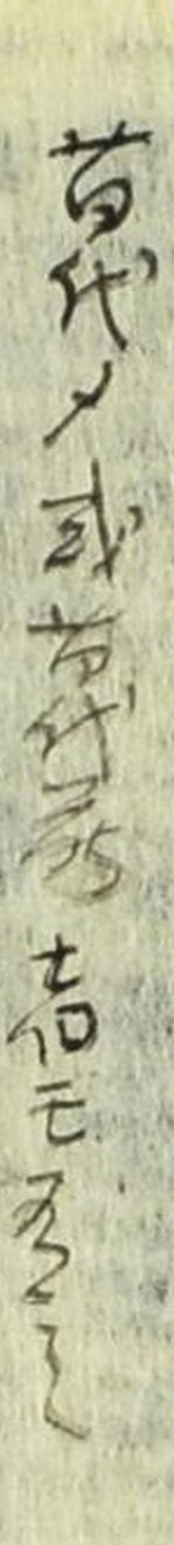苗代〆或苗代蒔宿モ有之
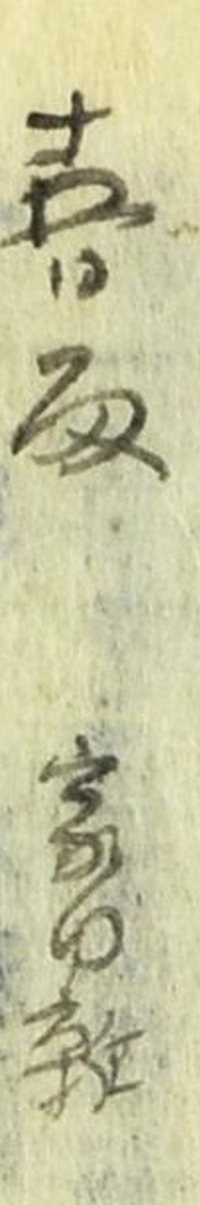十五日雨家内雑
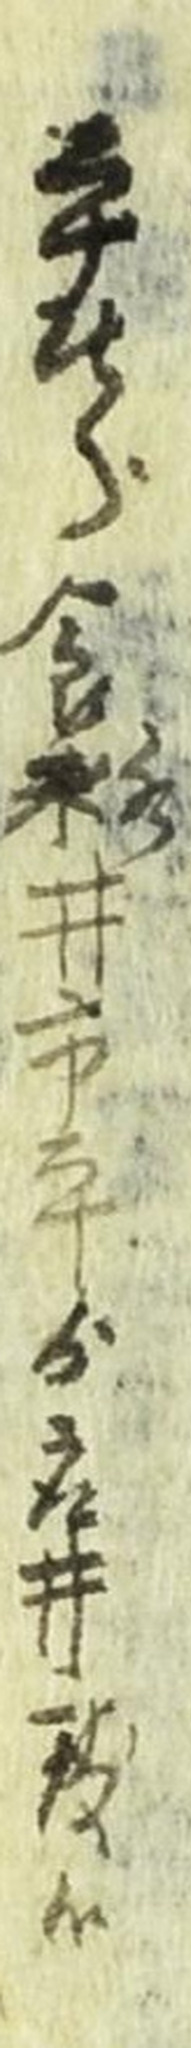平次郎食水井市平ゟ取井致候
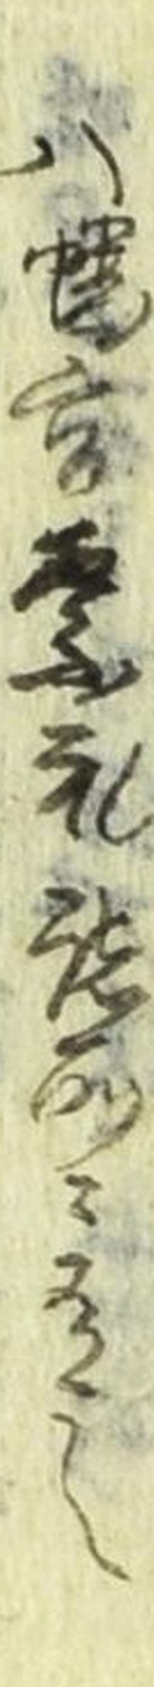八幡宮祭礼詣所々有之
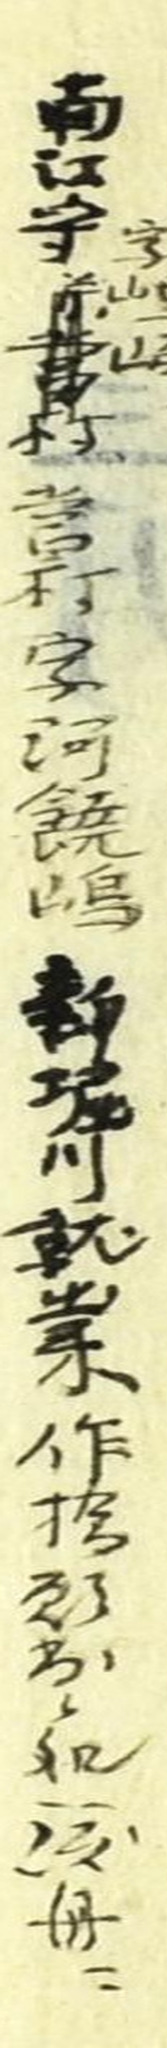南江守村字島崎当村字河饒島新堀川就業作橋願出候処渡舟ニ
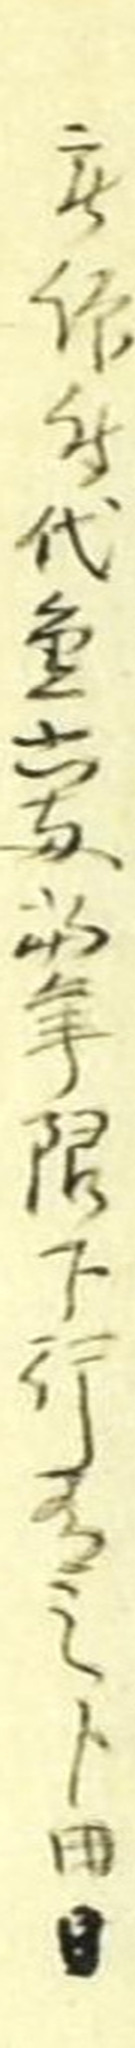被仰付代金六両当年限下行有之候由

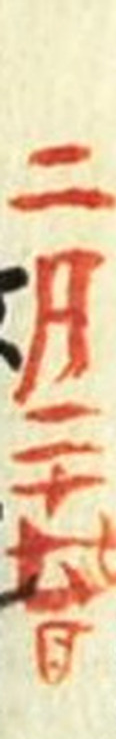二月二十七日
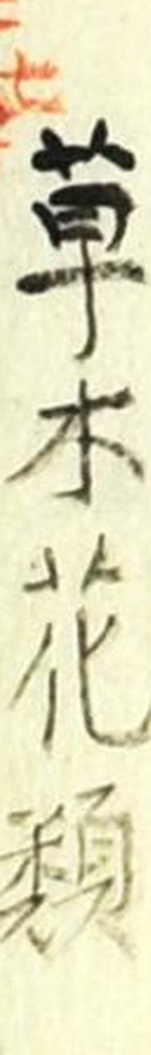草木花類
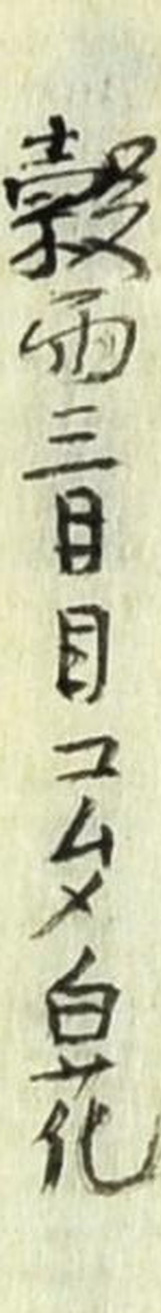穀雨三日目コムメ白花

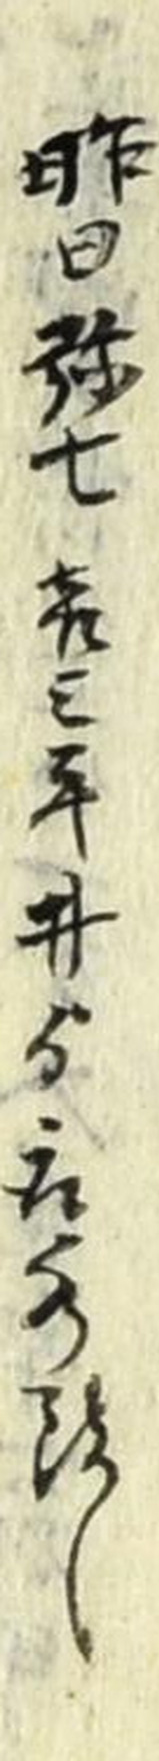昨日弥七喜三平井ゟ取水致候
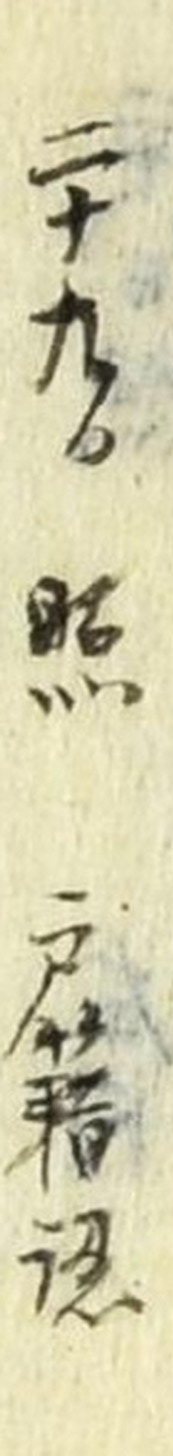二十九日照戸籍認
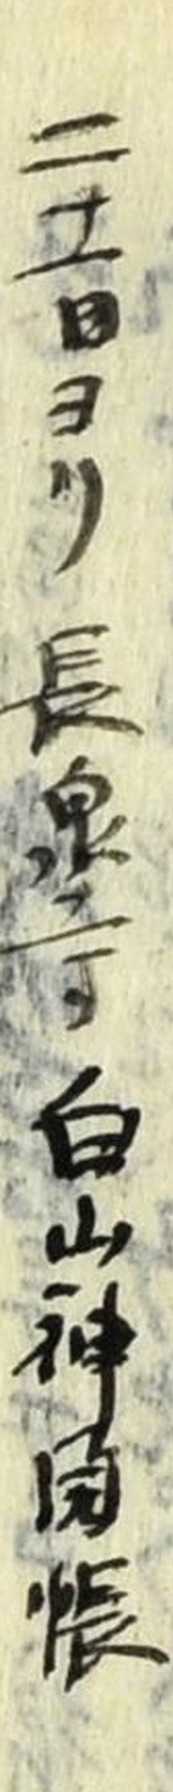二十一日ヨリ長泉寺白山神開帳
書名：（日記）
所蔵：福井県文書館 Fukui Prefectural Archives
